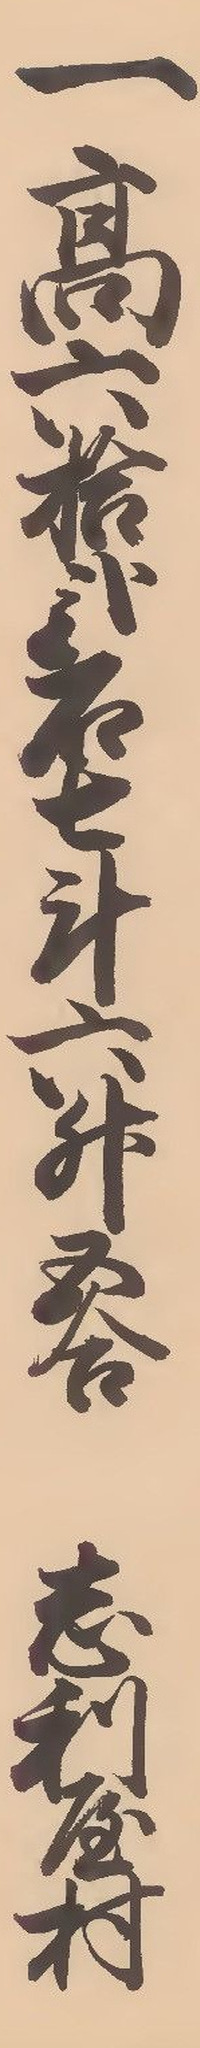一高六拾弐石七斗六升五合志利屋村

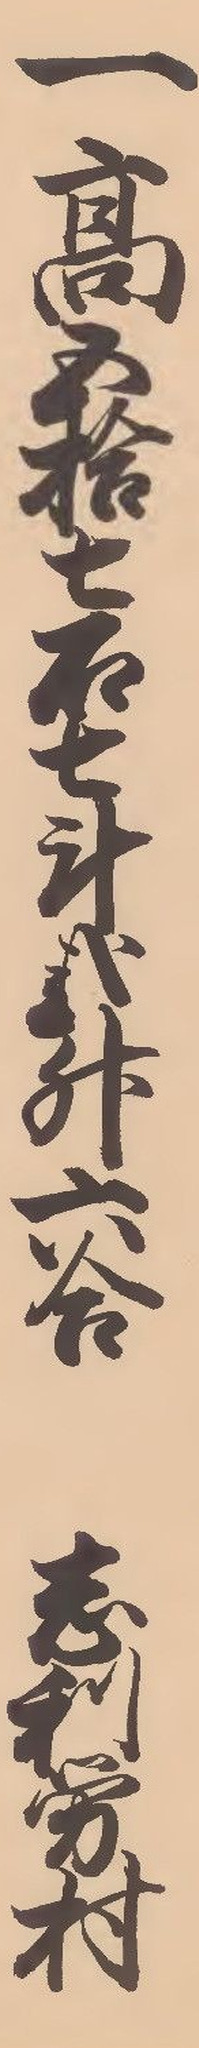一高五拾七石七斗弐升六合志利労村
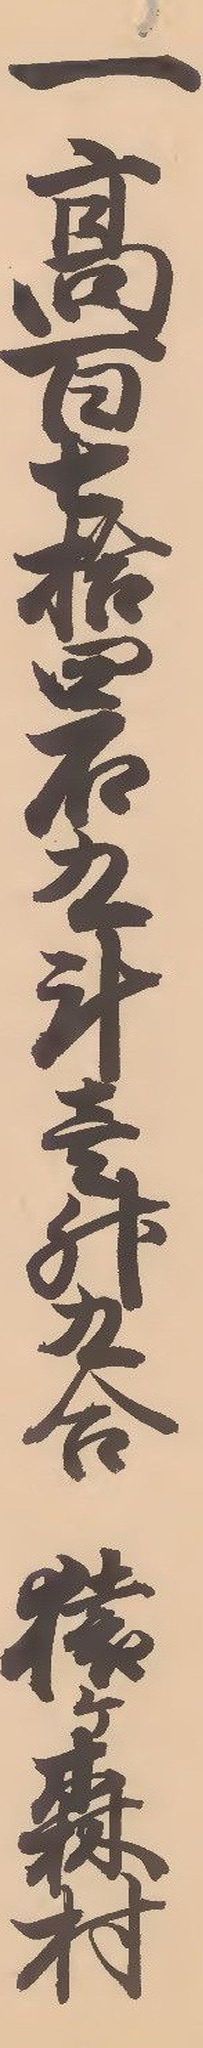一高百七拾四石九斗壱升九合猿ヶ森村
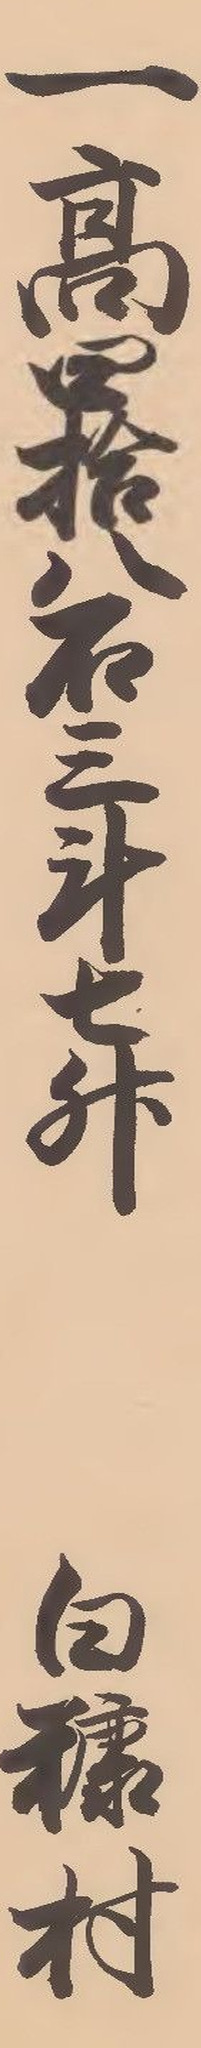一高四拾八石三斗七升白糠村
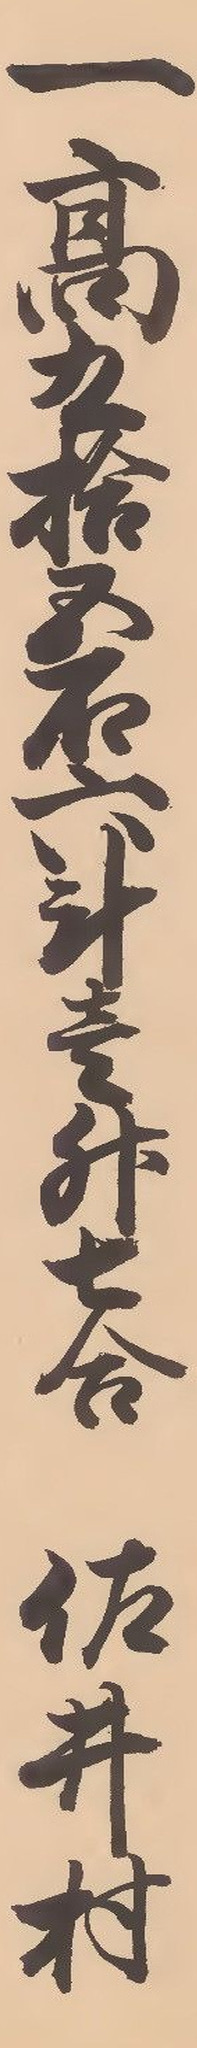一高九拾五石六斗壱升七合佐井村
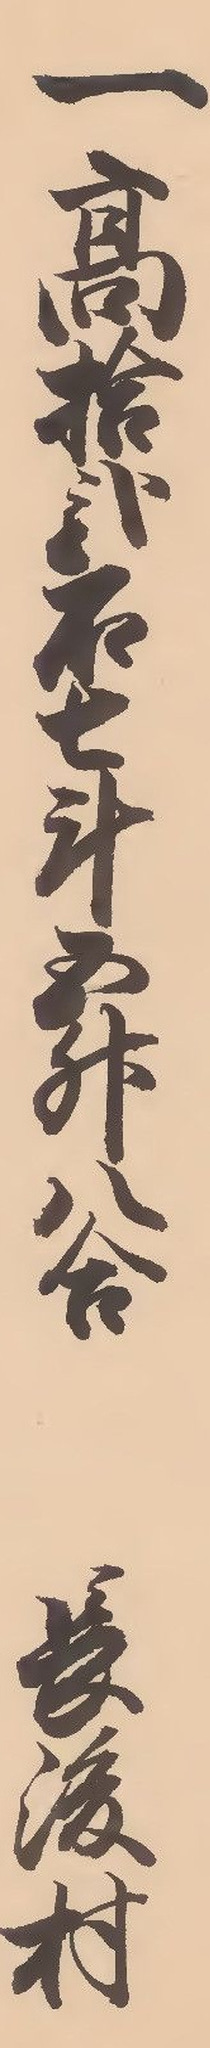一高拾弐石七斗五升八合長後村
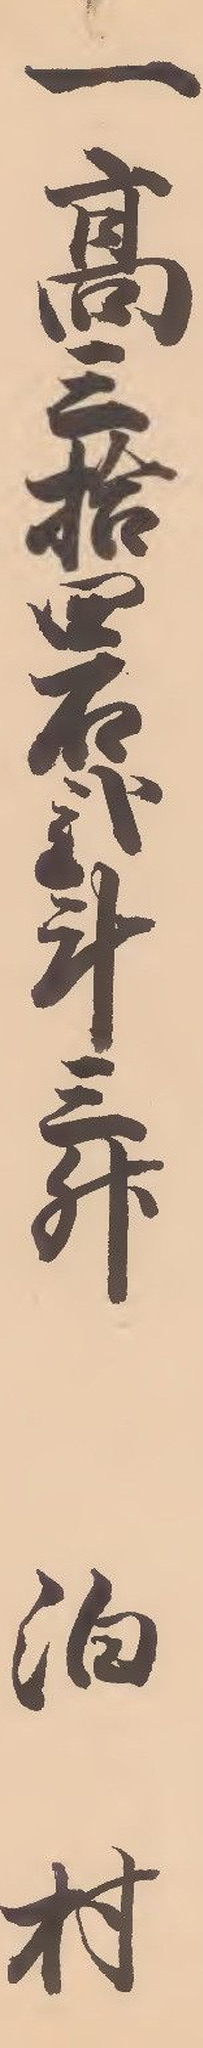一高三拾四石弐斗三升泊村
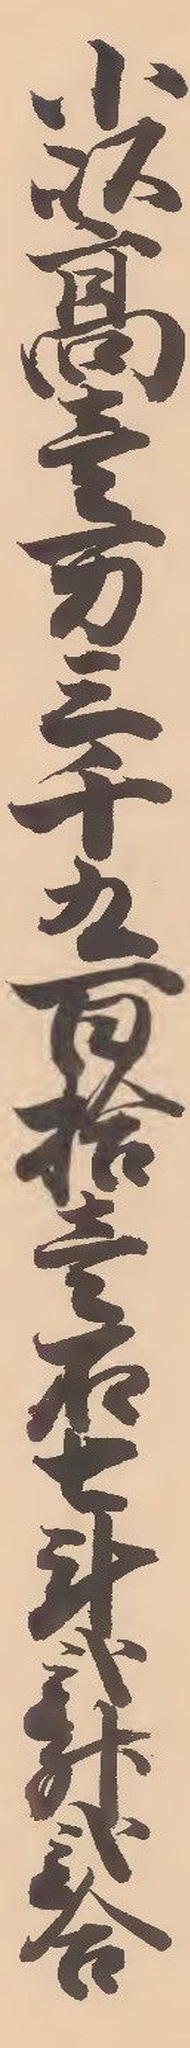小以高壱万三千九百拾壱石七斗弐升弐合

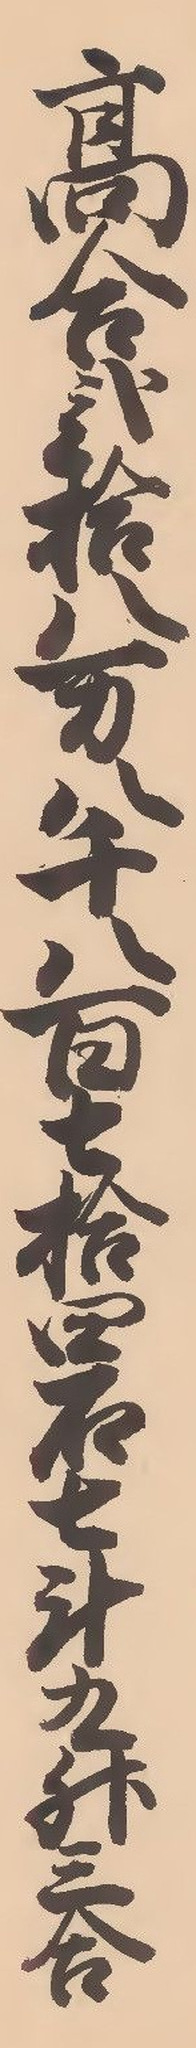高合弐拾八万八千八百七拾四石七斗九升三合
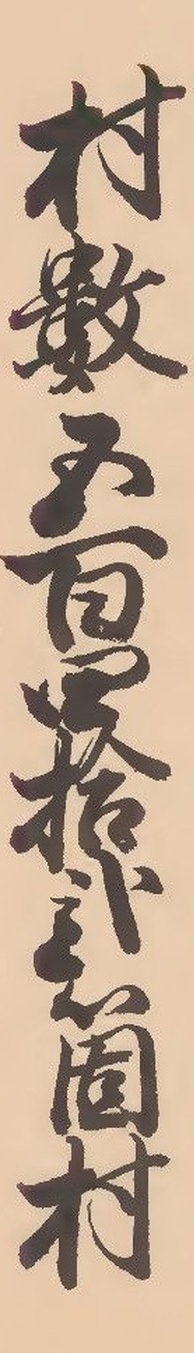村数五百四拾弐箇村
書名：陸奥国郷帳　６
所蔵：国立公文書館 National Archives of Japan
